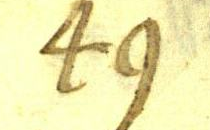49
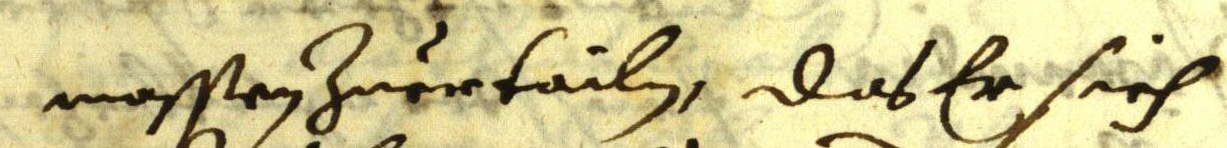massen Zūerteilen, das Er sich
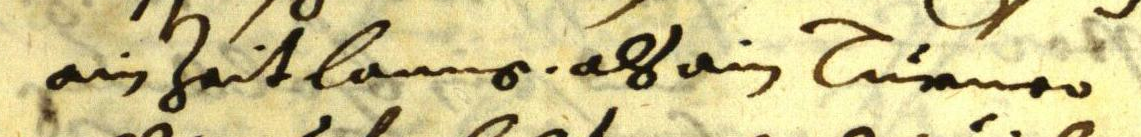ain Zeit lanng. als ain Tūrner
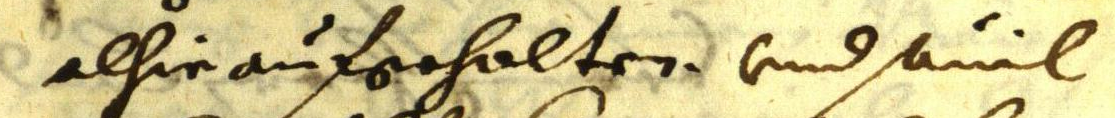alhie aūfgehalten. vnd soūil
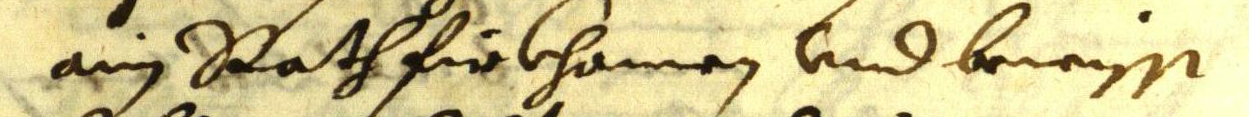ain Rath firkhomen vnd beweisst
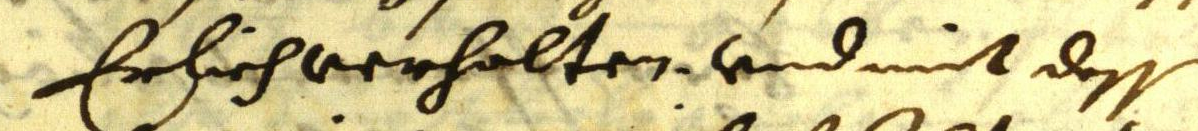Erlich verhalten. vnd mit dess
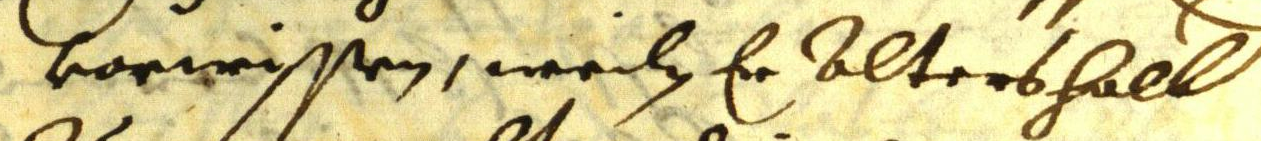Vorwissen, weiln Er Alters halb
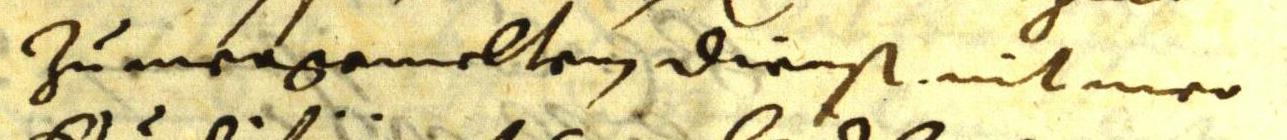Zū mergemeltem dienst. nit mer
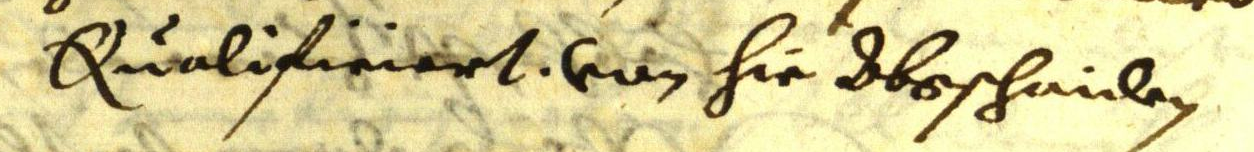Qūalificiert. von hie Abschaiden
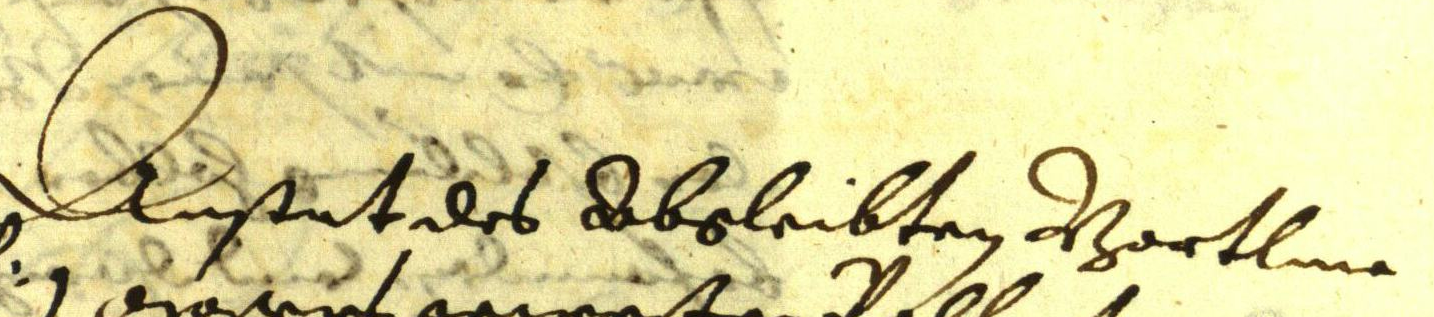Anstat des Abgleibten Bartlme
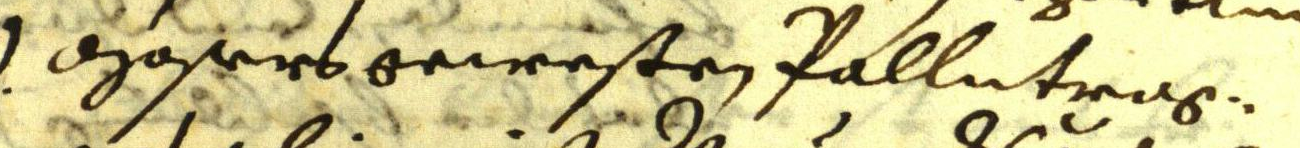Mosers gewesten Pallntrag¬
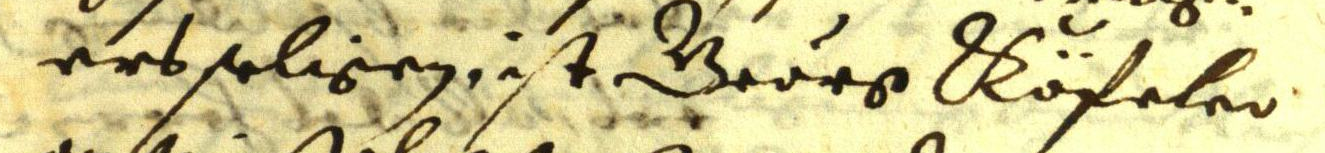ers seligen. ist Geōrg Köfeler
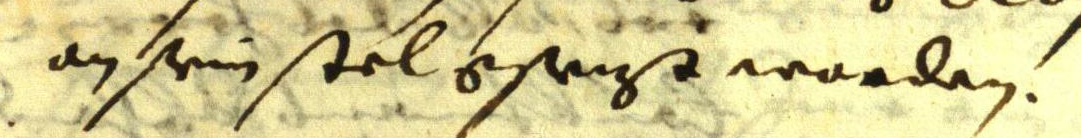an sein stel gsetzt worden.
